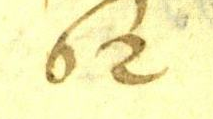62
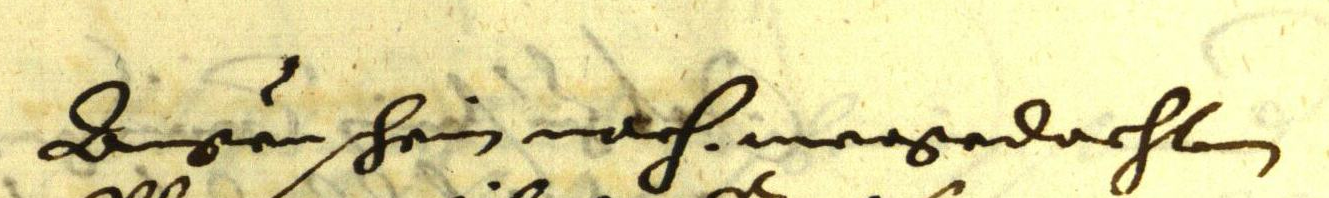Aūgenschein nach. mergedachten
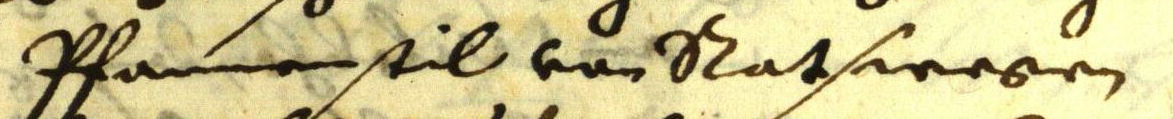Pfannenstil von Ratswegen
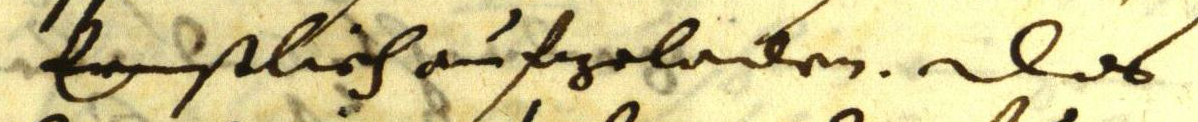Ernnstlich aūfzeladen. Das
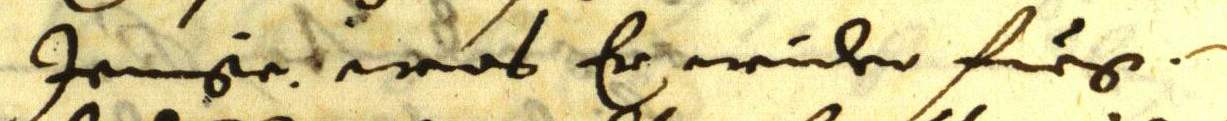Jennige. was Er wider fūeg.
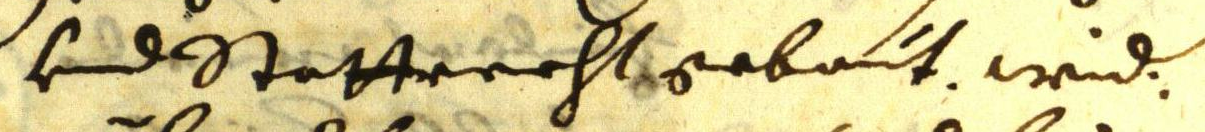vnd Stattrecht gebaūt. wid¬
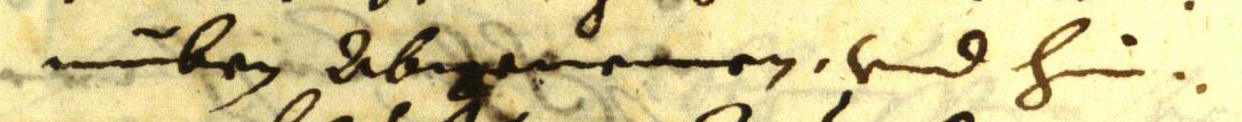ūmben Abgenomen. vnd hin¬
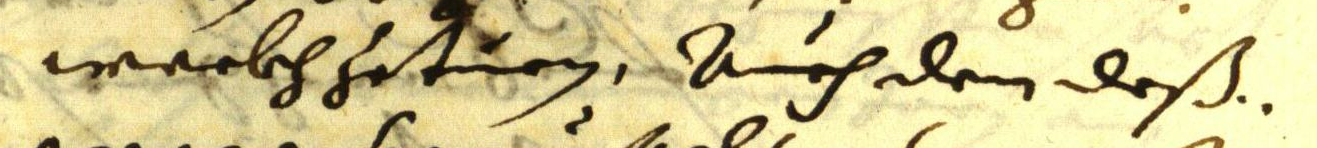weckh Zethūen, Aūch dem deß¬
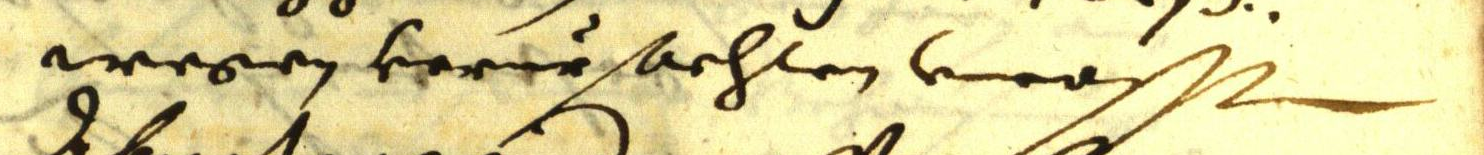wegen verūrsachten vncosst
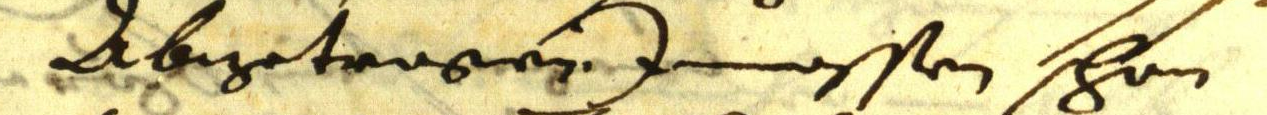Abzetragen. Inmassen schon
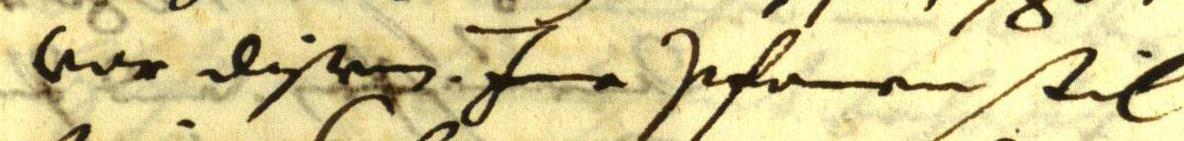vor disem. Ime Pfannenstil
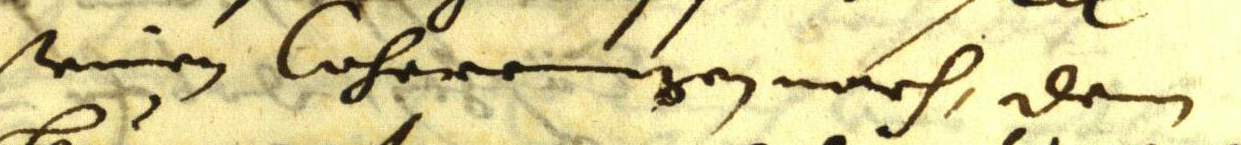seinen Coherennzen nach, dem
